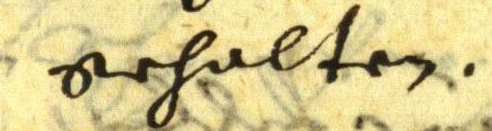gehalten.
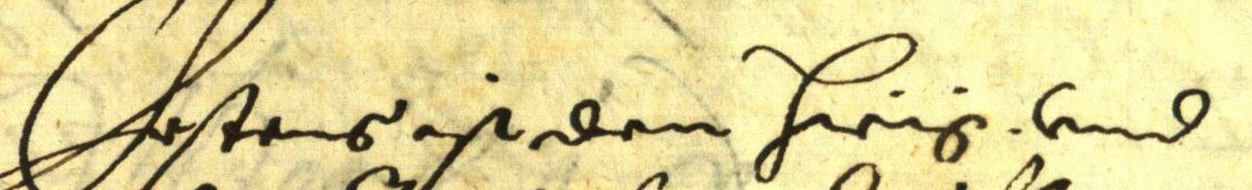Erstens ist den Hieig. vnd
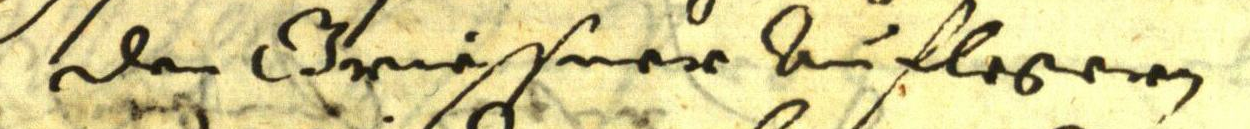den Griessner Aūflegern
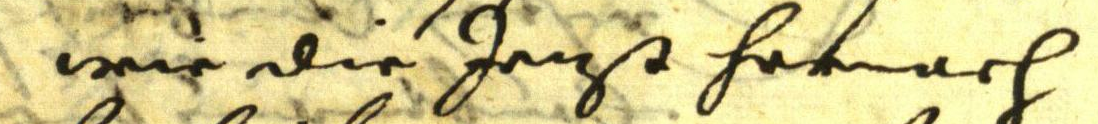wie die Jezt hernach
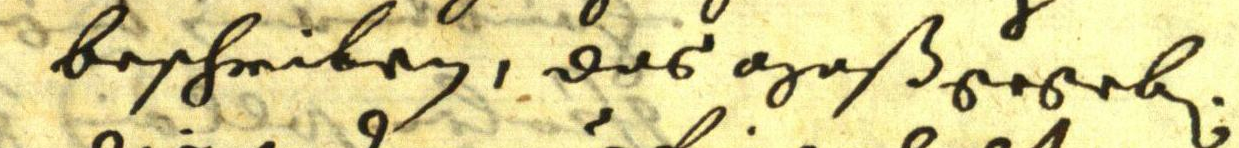beschriben, das Maß gegeb.
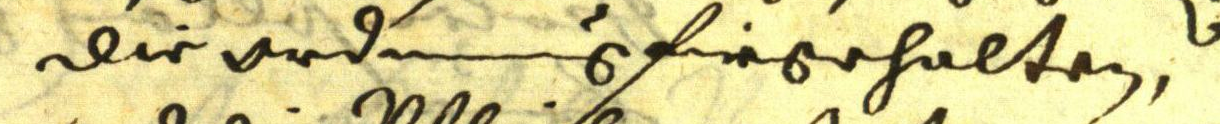die ordnūng firgehalten,
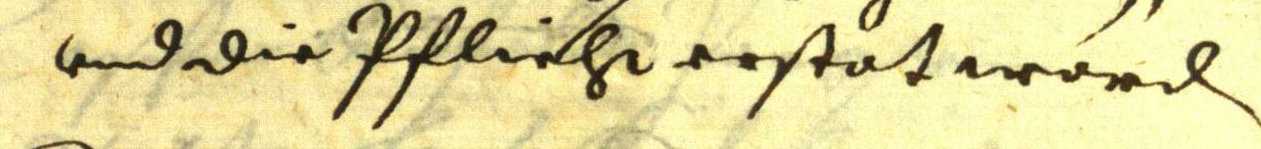vnd die Pflicht erstat word.
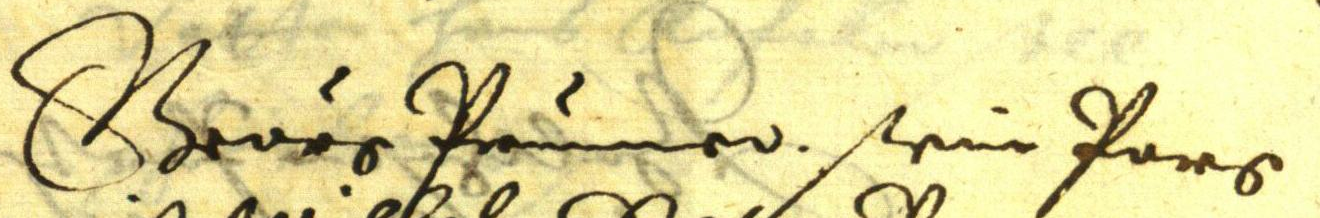Geōrg Prūnner. sein Porg
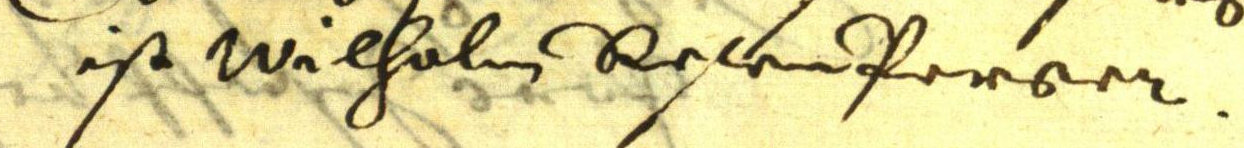ist Wilhalm ResenPerger.
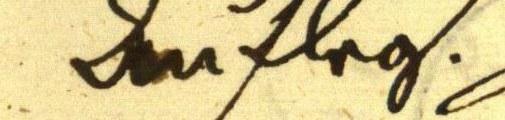Aūfleg.
